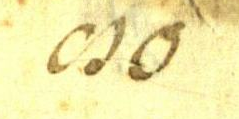80
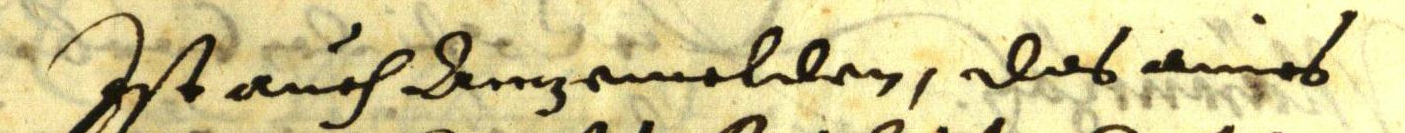Ist aūch Anzemelden, das aines
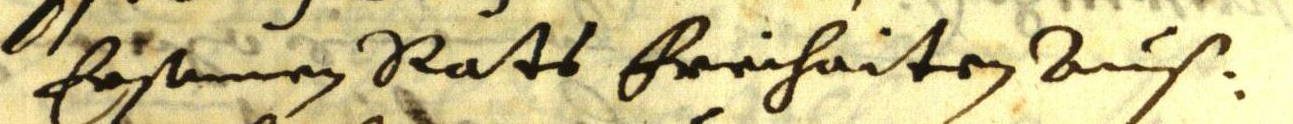Ersamen Rats Freihaiten Aūs-
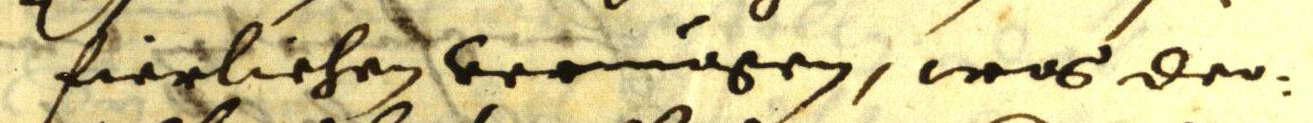fierlichen vermōgen, was der¬
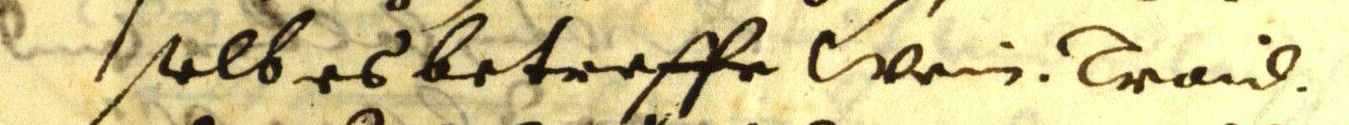selb es betreffe Wein. Traid.
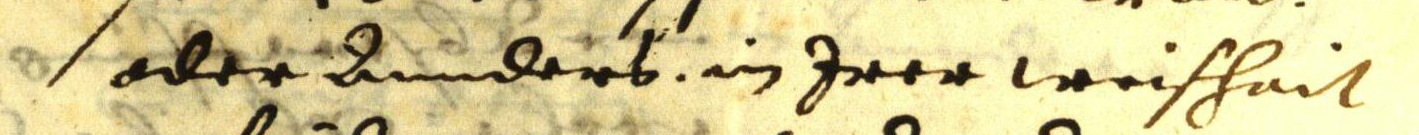oder Annders. in Irer weishait
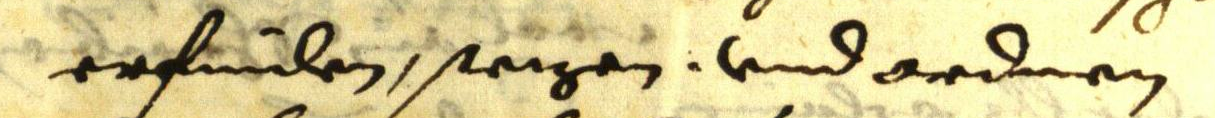erfūnden, sezen. vnd ordnen
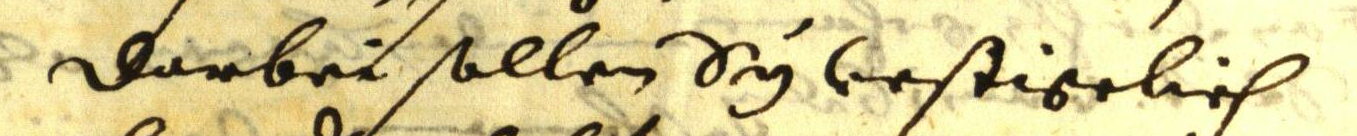darbei sollen Sȳ vestigelich
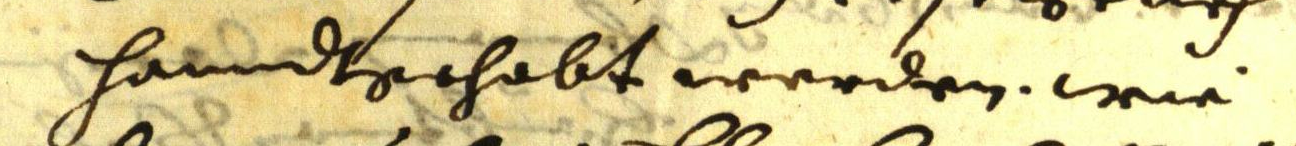hanndtgehabt werden. wie
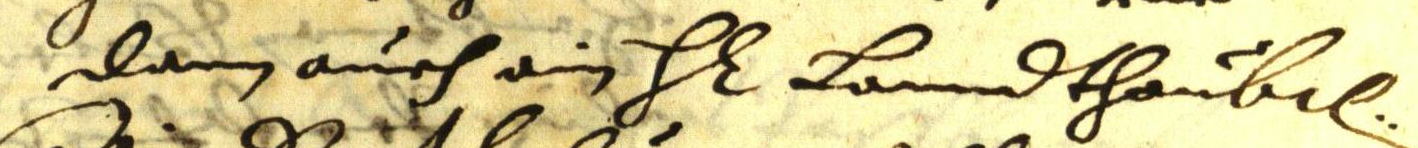dann aūch ain hl Lanndthaūbt:
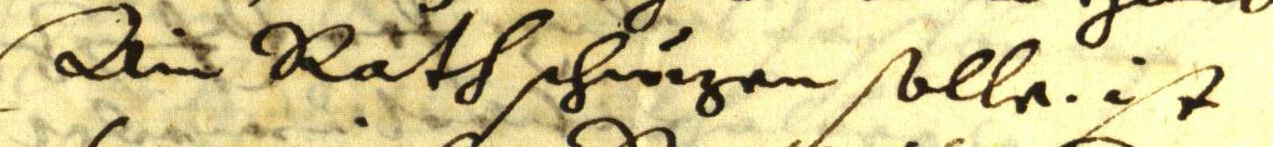Ain Rath schūzen solle. ist
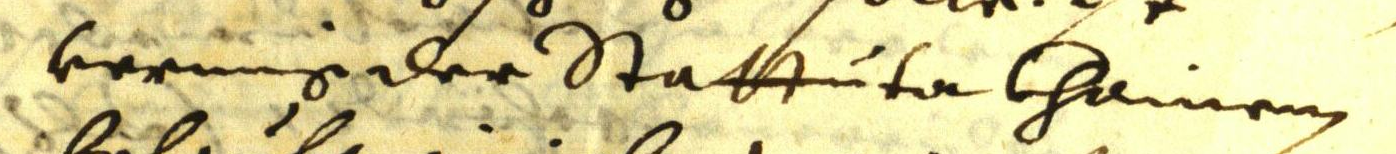vermig der Stattūta khainem
